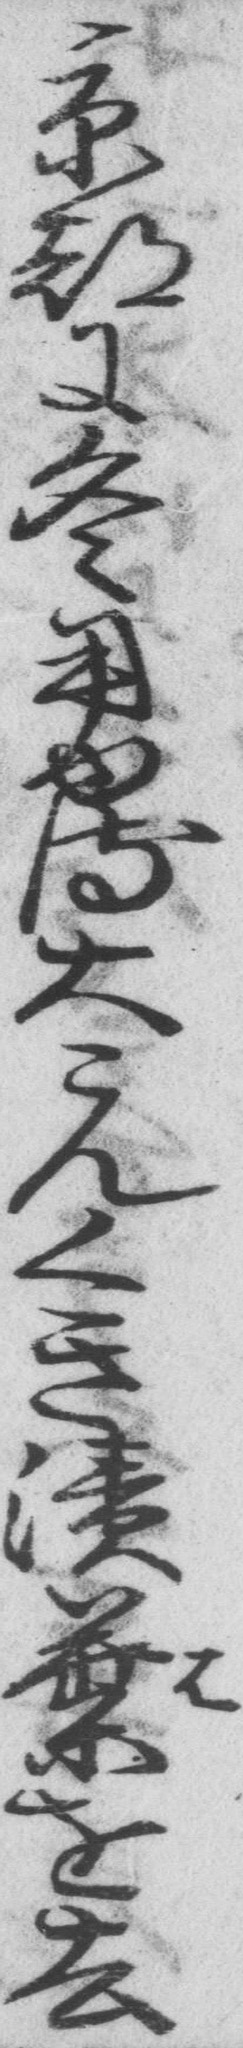京都に冬用ゆる大こんくき漬葉を去
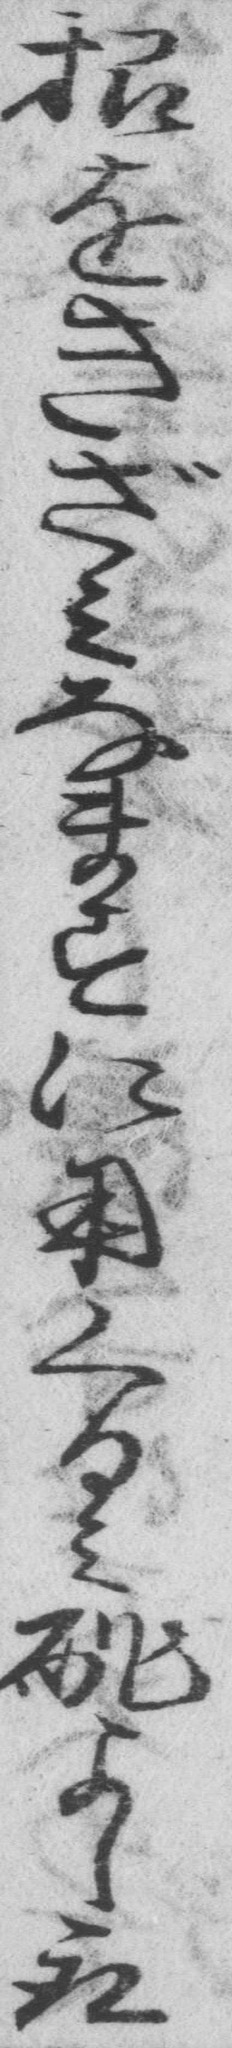根をきざみなますに用くるみ酢よし取
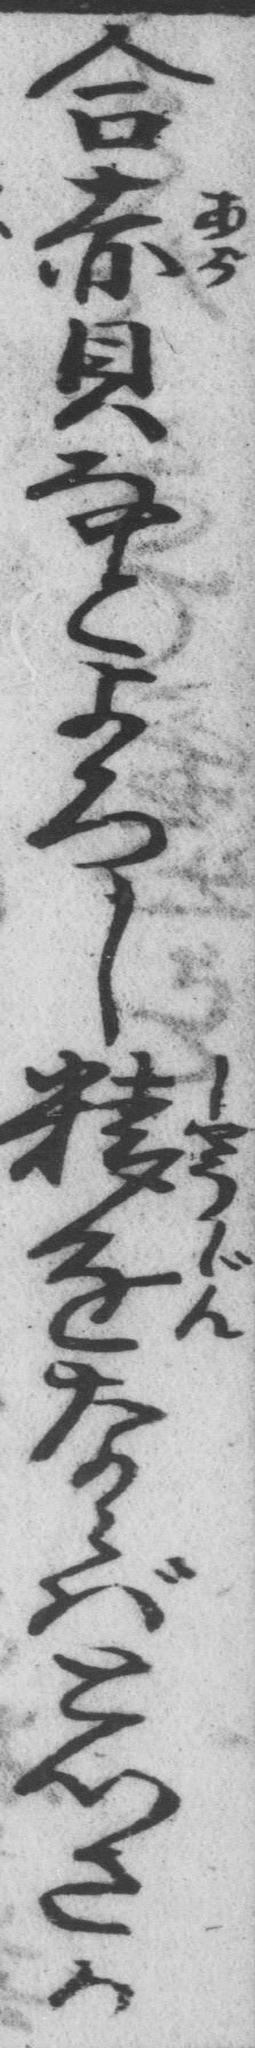合赤貝なとよろし精進ならばとつさか
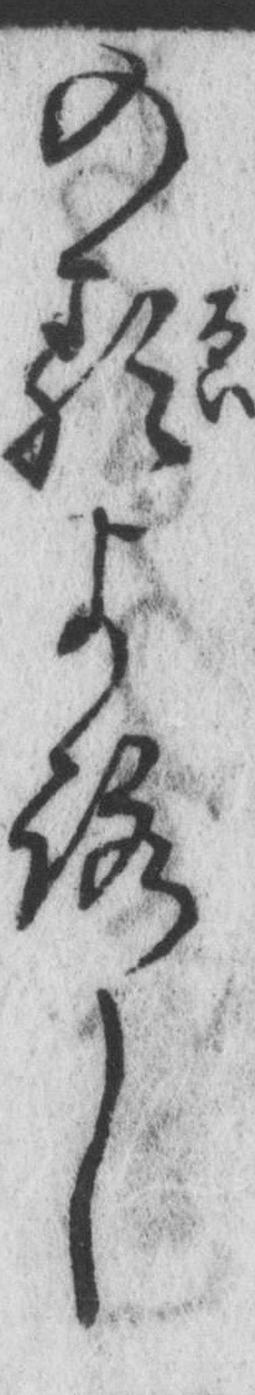の類よろし
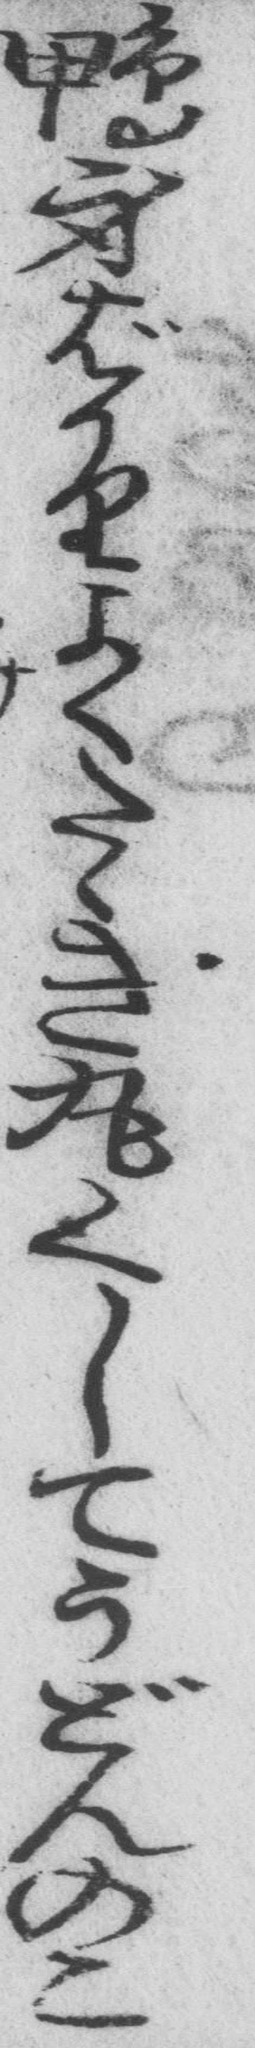鴨身ばかりよくたゝき丸くしてうどんのこ
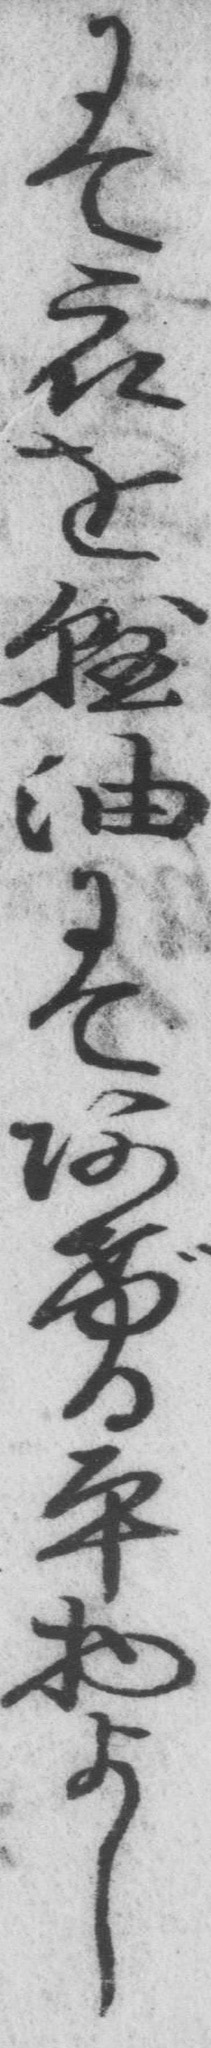にて衣を懸油にてあげる平物よし
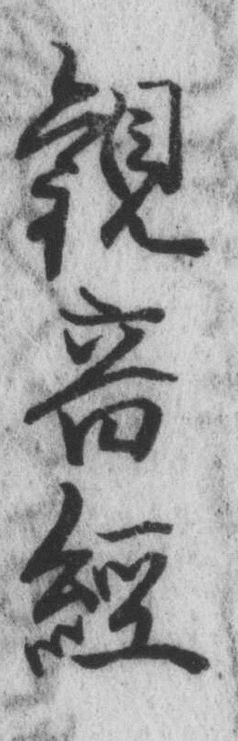観音経
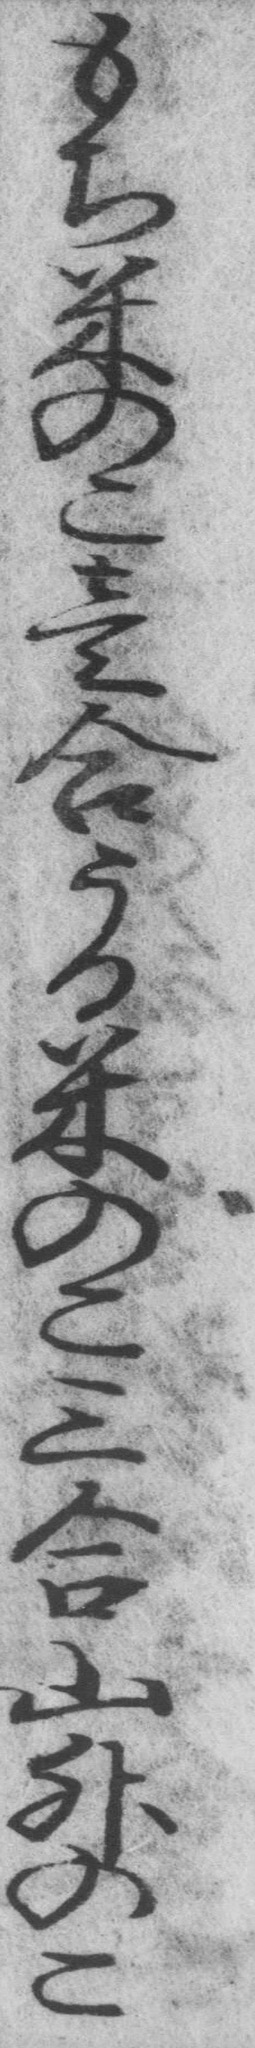もち米のこ壱合うる米のこ三合山升のこ

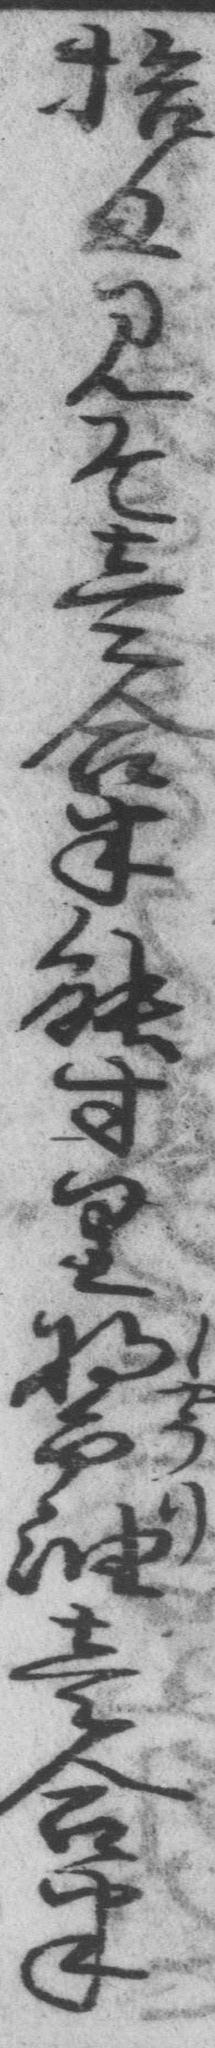拾匁みそ壱合半能すり醤油壱合半
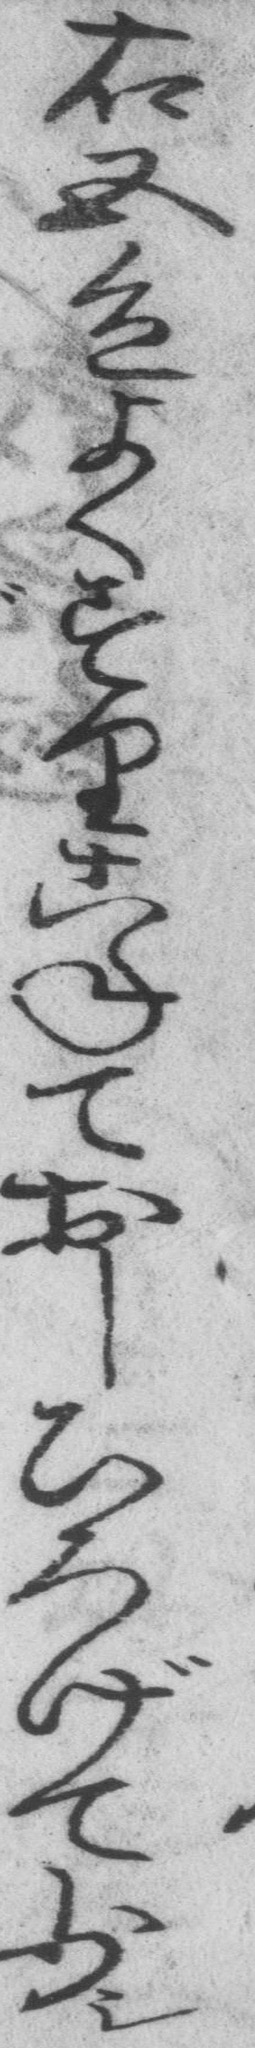右五色よくすりこねておしひろげて少し
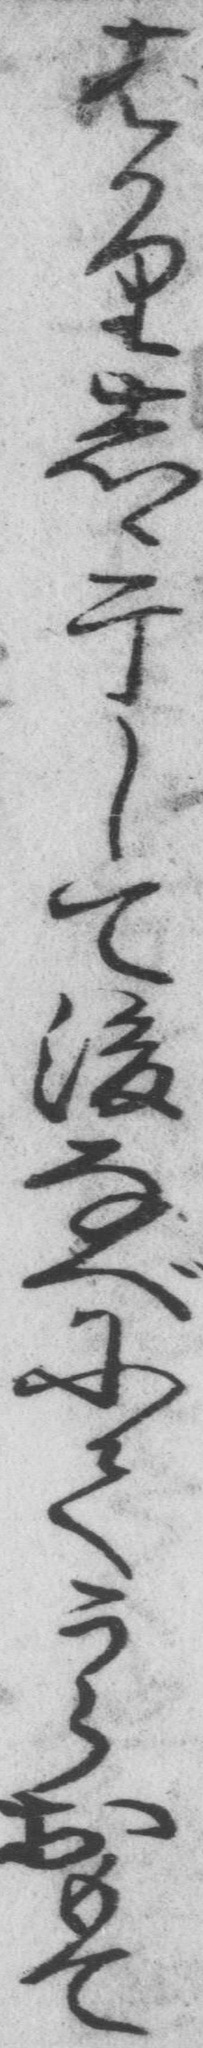ばかりしゝ干して後なべにてうらおもて
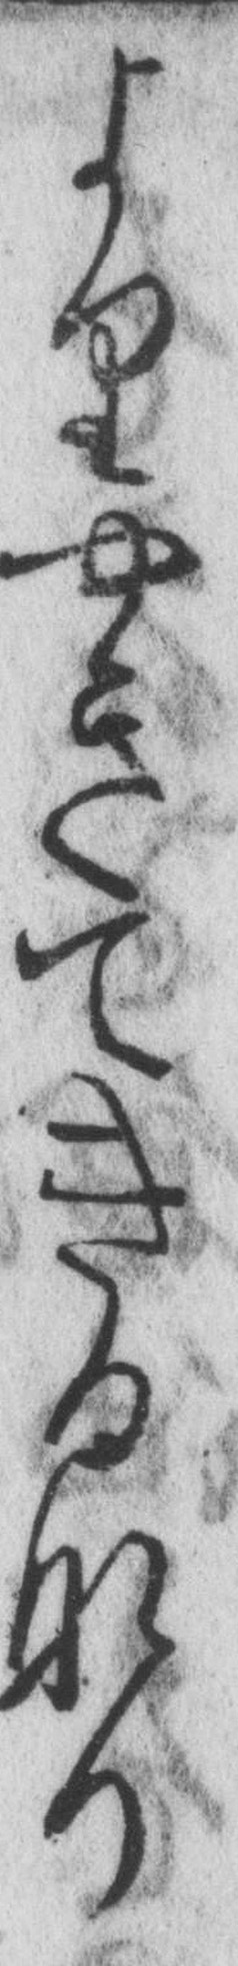よりやきてきるなり
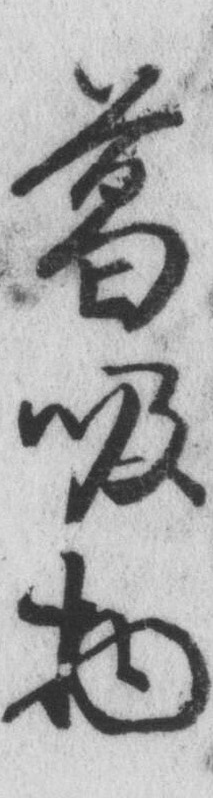葛吸物
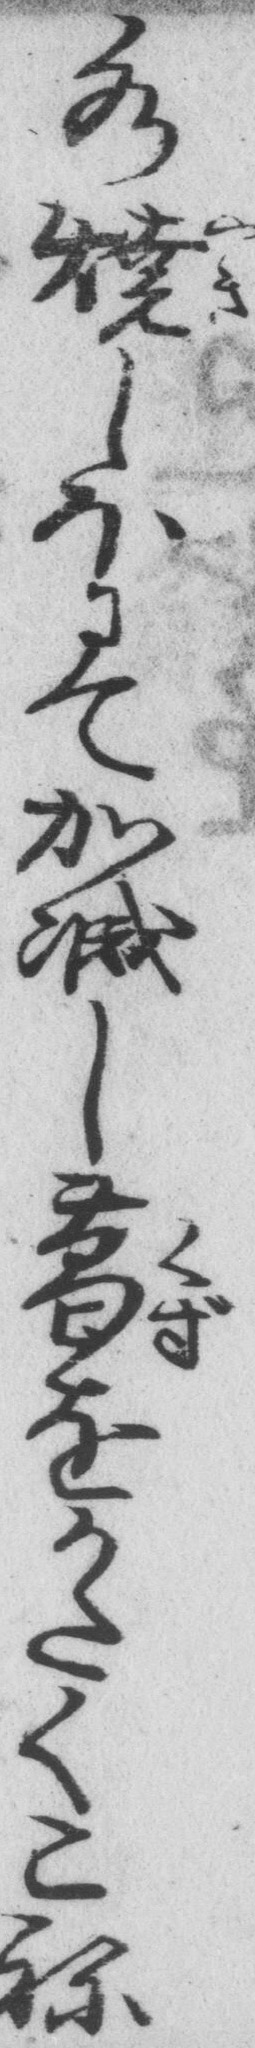水焼しほにて加減し葛をかたくこね
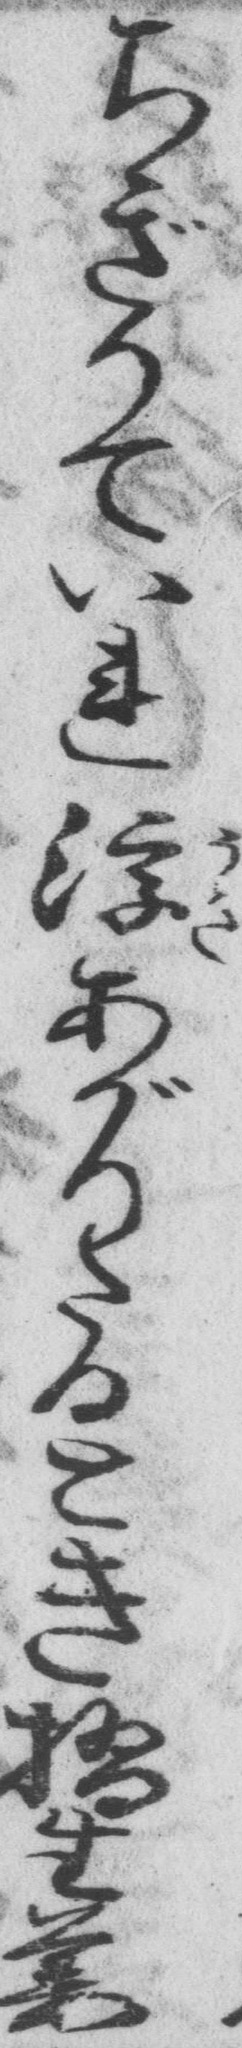ちぎりていれ浮あがりたるとき摺生姜
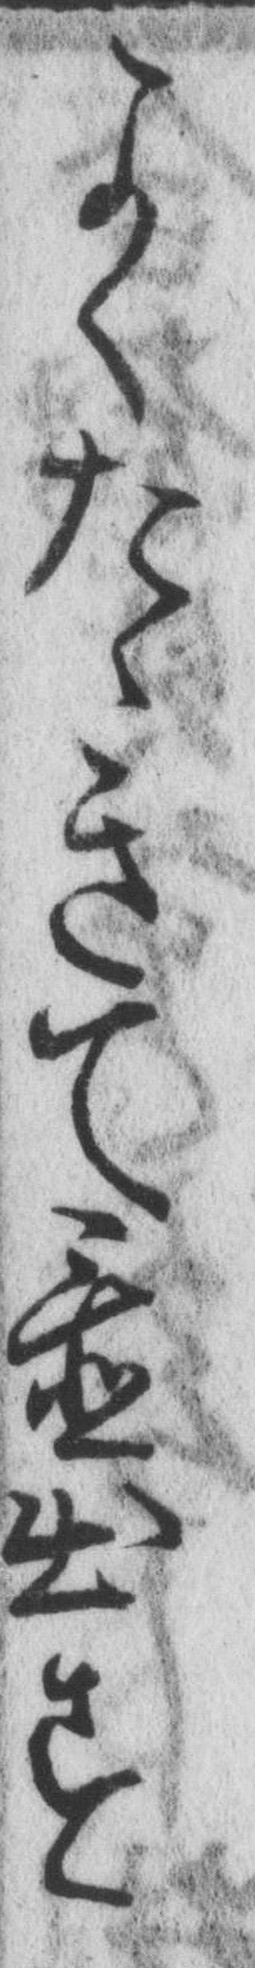よくたゝきて置出す
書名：料理山海郷
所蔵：大阪府立大学学術情報センター 国文学研究資料館
